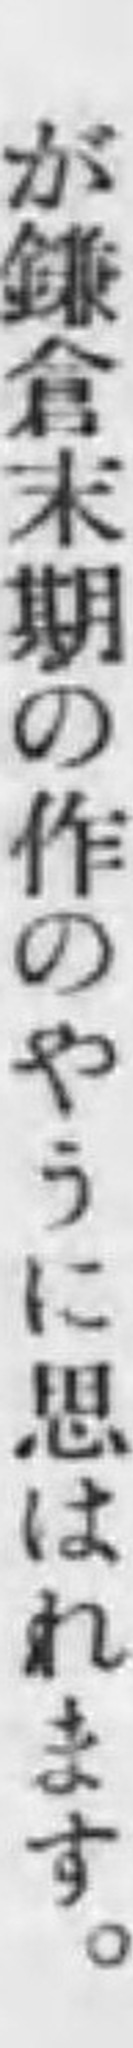が鎌倉末期の作のやうに思はれます。
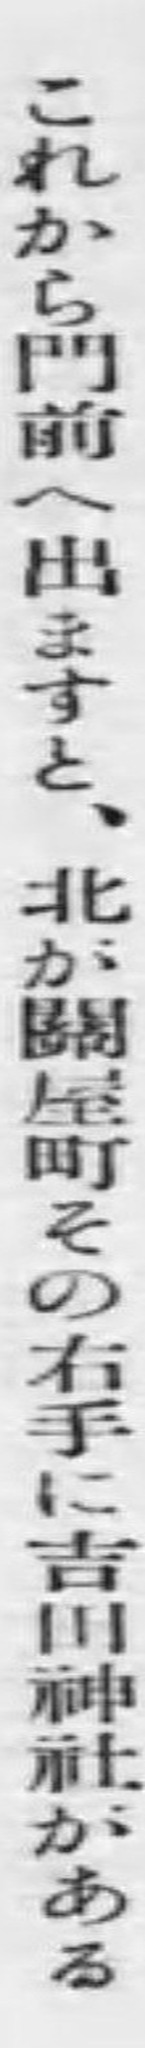これから門前へ出ますと、北が関屋町その右手に吉田神社がある
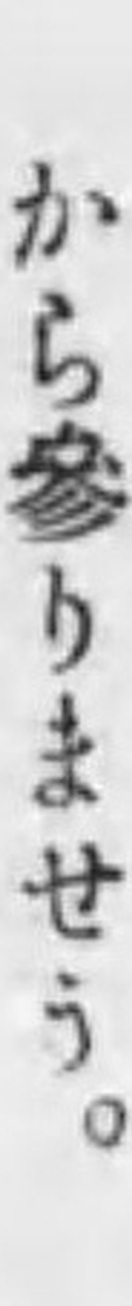から参りませう。
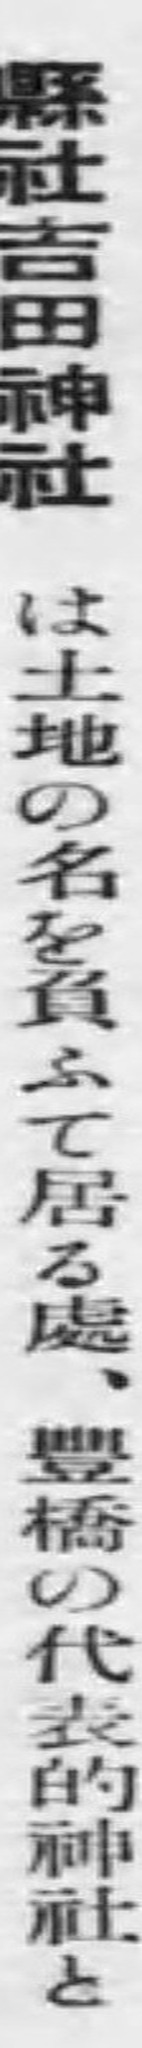県社吉田神社は土地の名を負ふて居る処、豊橋の代表的神社と
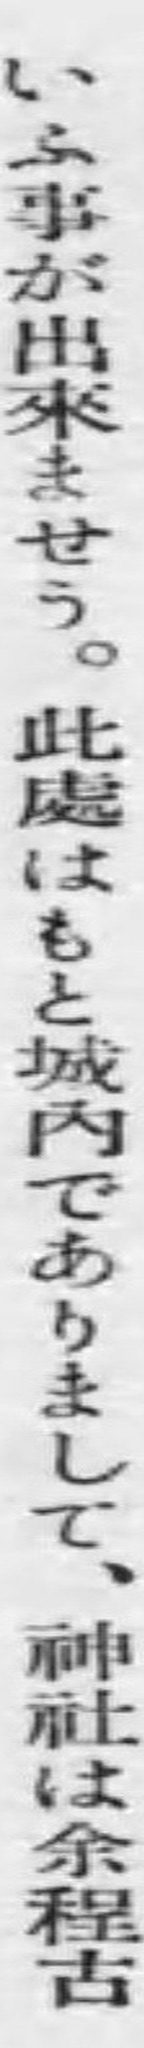いふ事が出来ませう。此処はもと城内でありまして、神社は余程古
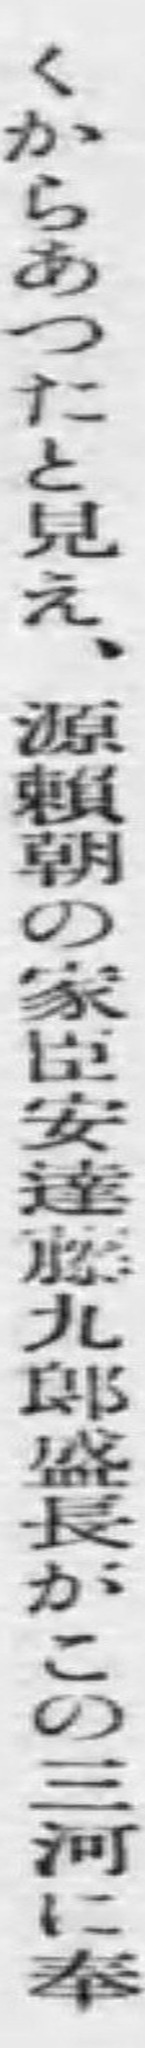くからあつたと見え、源頼朝の家臣安達藤九郎盛長がこの三河に奉
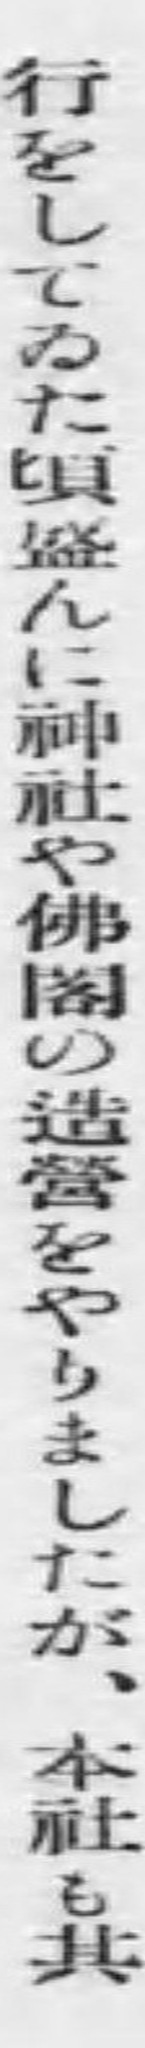行をしてゐた頃盛んに神社や仏閣の造営をやりましたが、本社も其
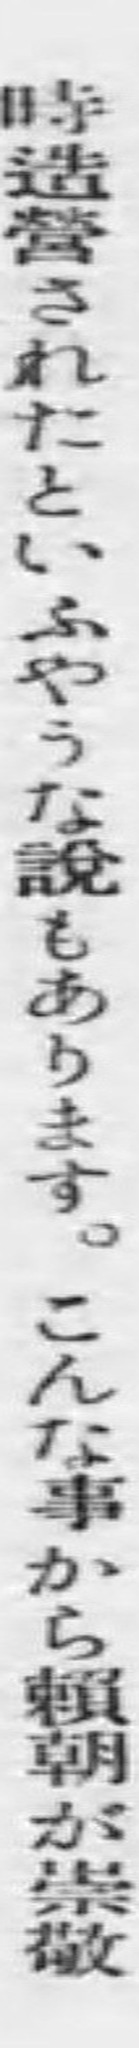時造営されたといふやうな説もあります。こんな事から頼朝が崇敬
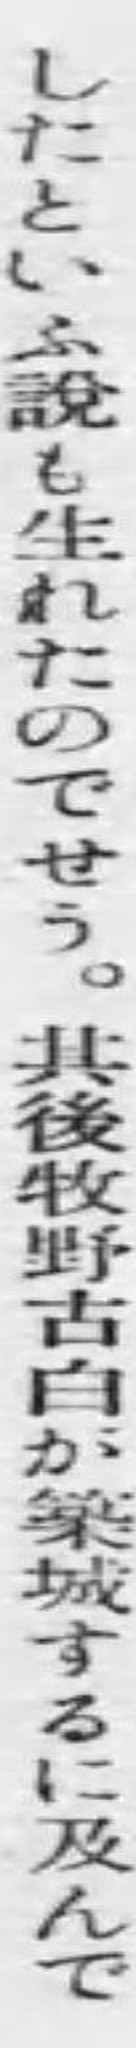したといふ説も生れたのでせう。其後牧野古白が築城するに及んで
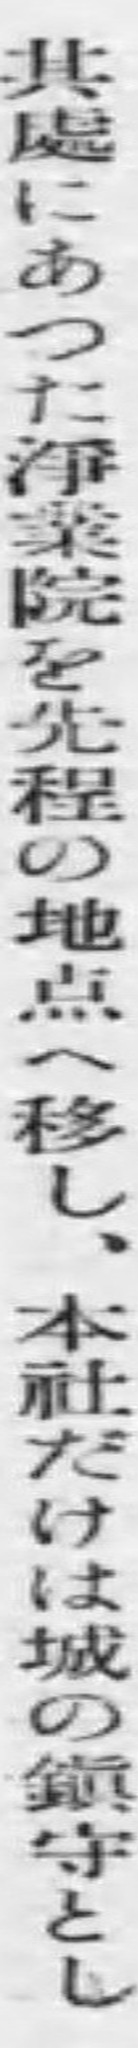其処にあつた浄業院を先程の地点へ移し、本社だけは城の鎮守とし
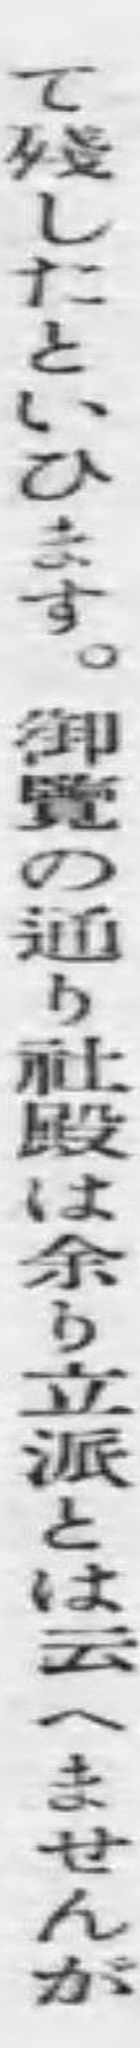て残したといひます。御覧の通り社殿は余り立派とは云へませんが

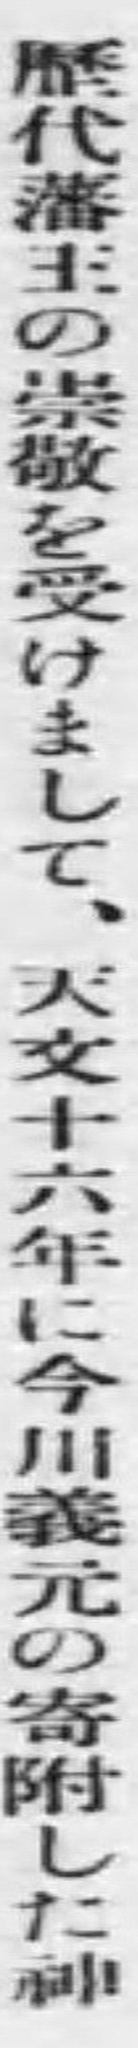歴代藩主の崇敬を受けまして、天文十六年に今川義元の寄附した神
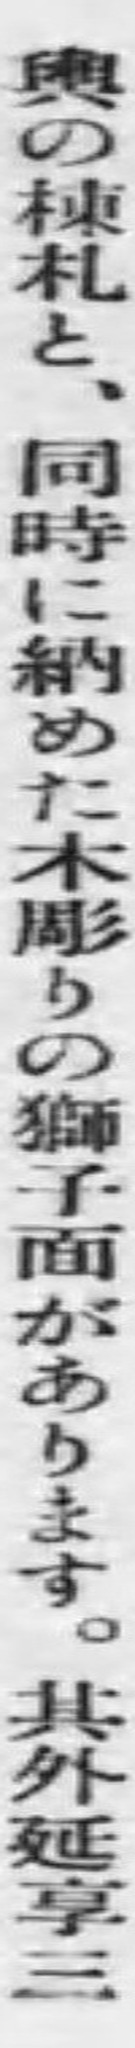輿の棟札と、同時に納めた木彫りの獅子面があります。其外延享三
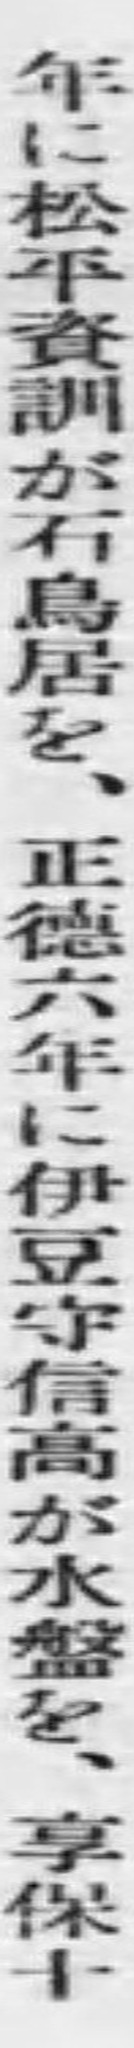年に松平資訓が石鳥居を、正徳六年に伊豆守信高が水盤を、享保十
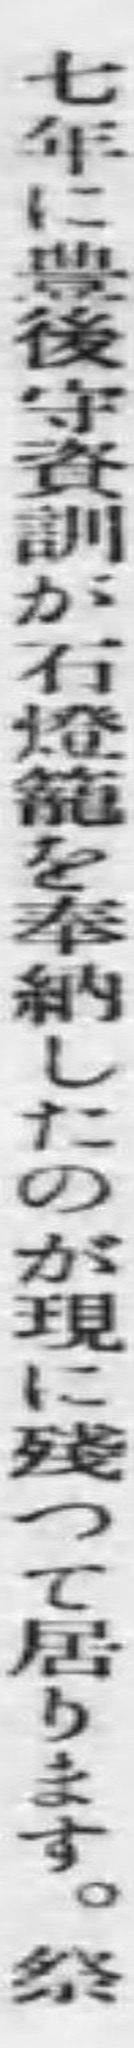七年に豊後守資訓が石灯籠を奉納したのが現に残つて居ります。祭
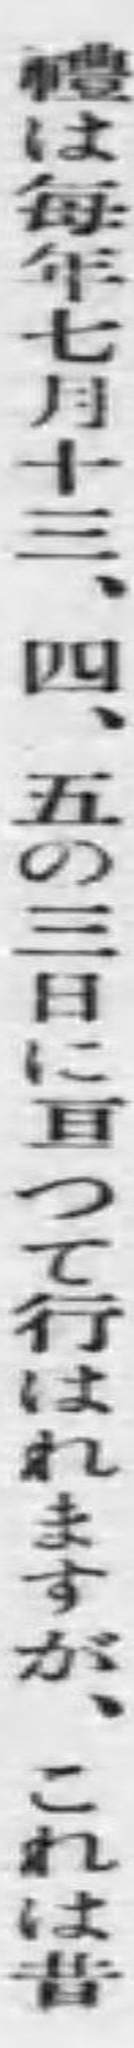礼は毎年七月十三、四、五の三日に亘つて行はれますが、これは昔
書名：東三河道中記 : 豊橋市及其附近案内
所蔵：国立国会図書館 National Diet Library, JAPAN
